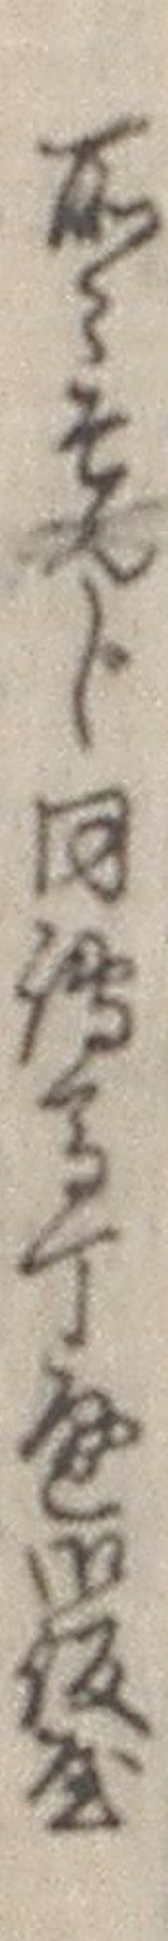所〻そんじ同傳馬丁通御仮屋
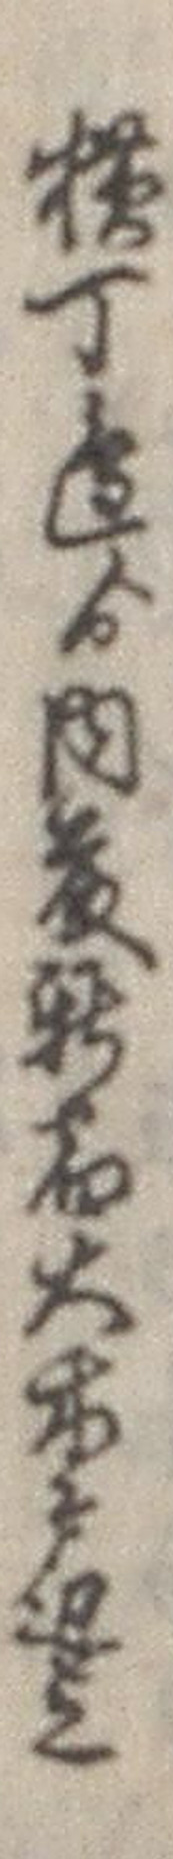横丁邊ゟ内藤新宿大木戸辺迄
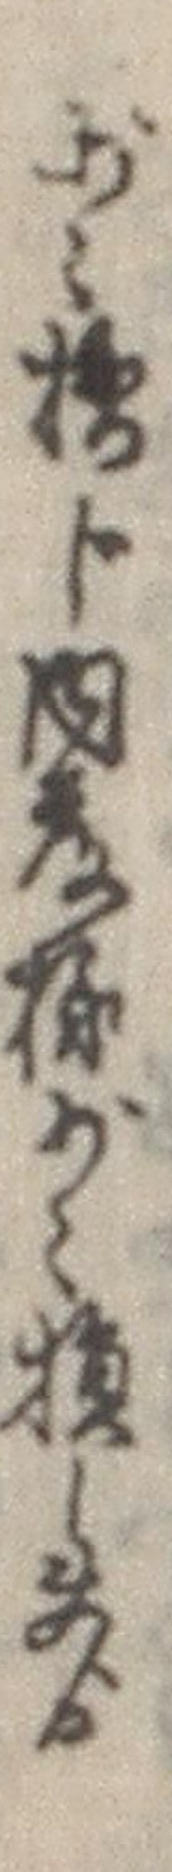少〻損じ内藤様少〻損し夫ゟ
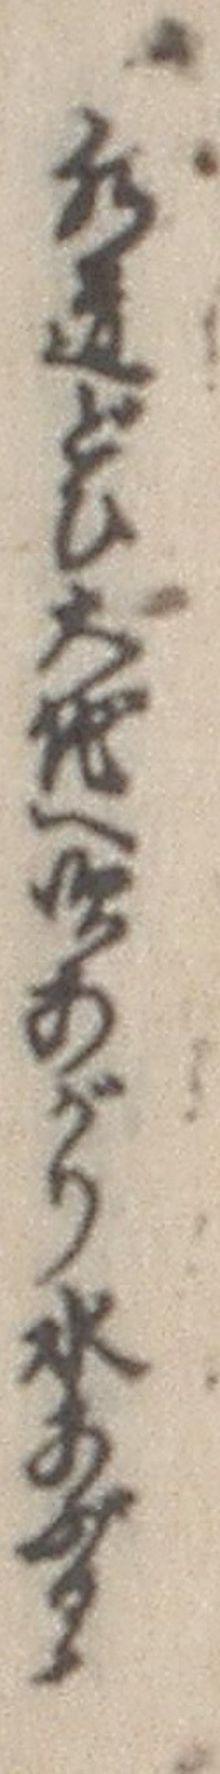水道どひ大地へ吹あがり水あぶる
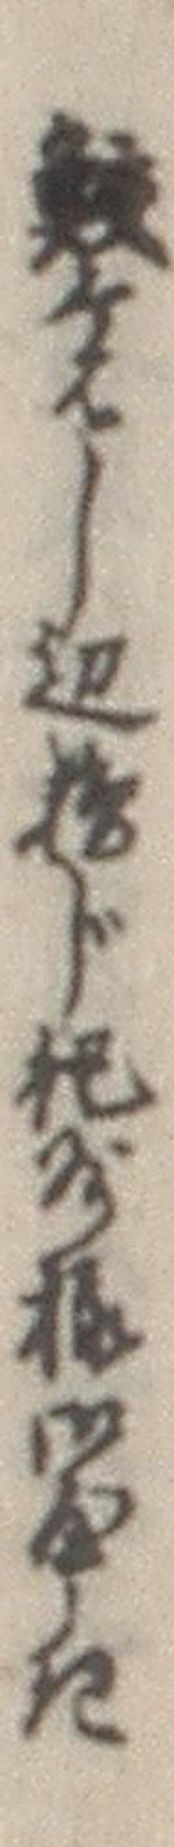鮫ケはし辺損じ紀州様御屋しき
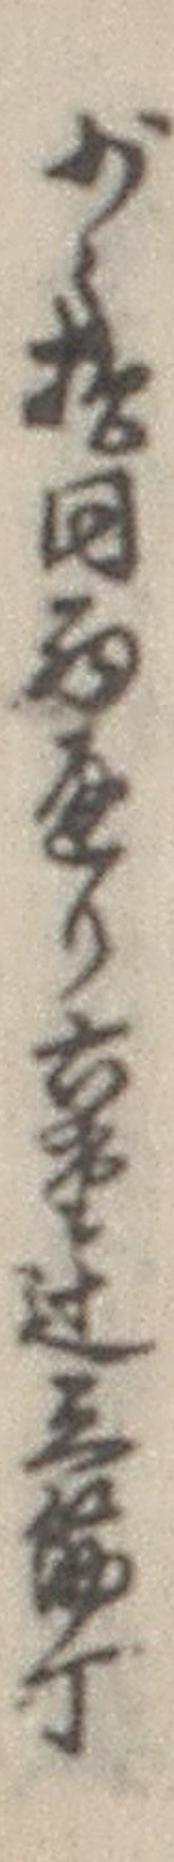少〻損同西通り六堂辻三筋丁
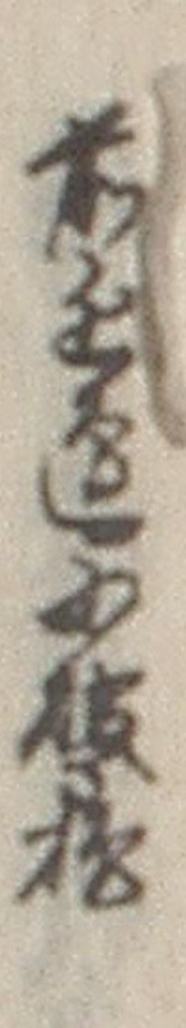前近邊少破損
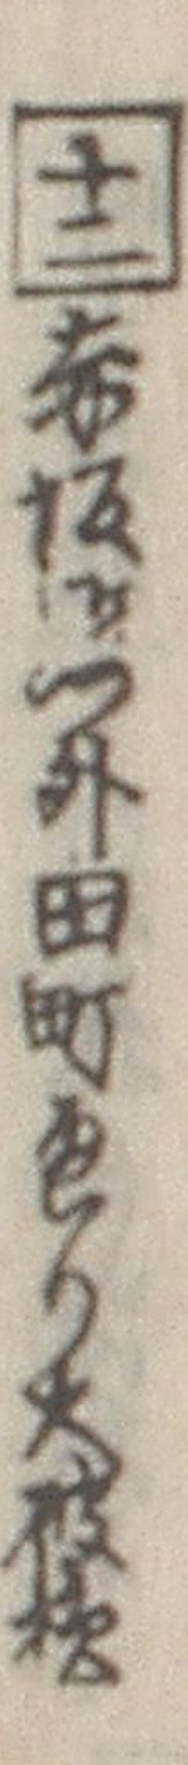十二赤坂御門外田町通り大破損
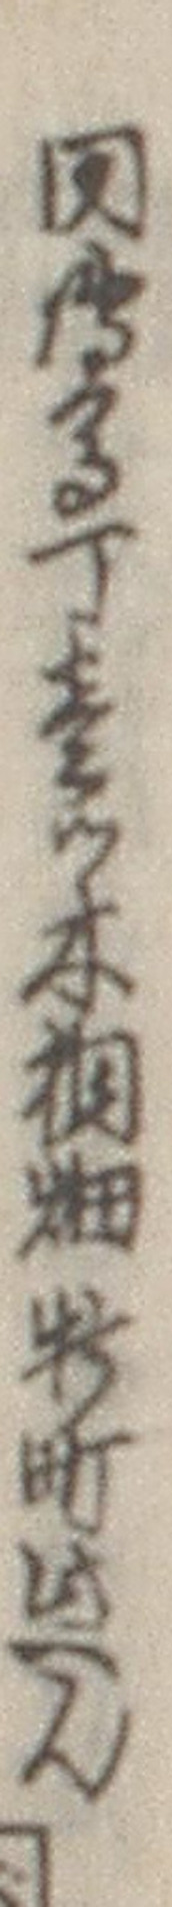同傳馬丁壱ツ木相畑新町此へん
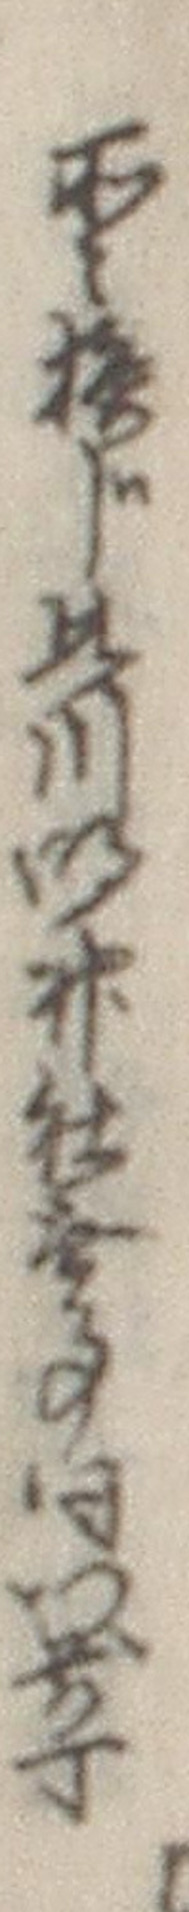所〻損じ比川明神社無事同門前丁
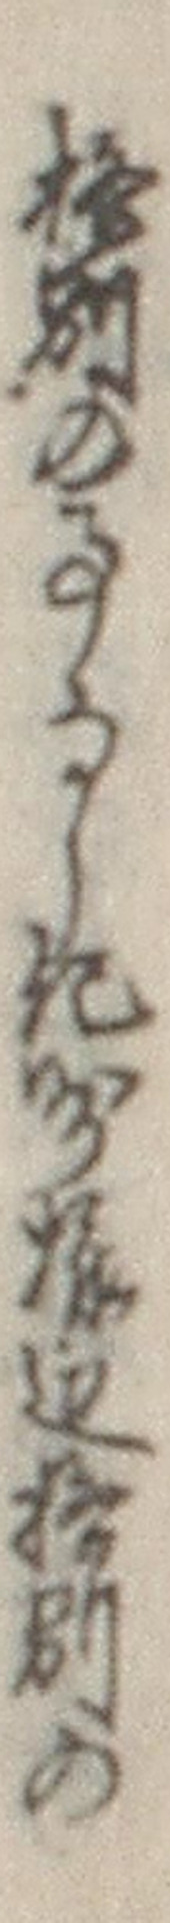格別の事なし紀州様辺格別の
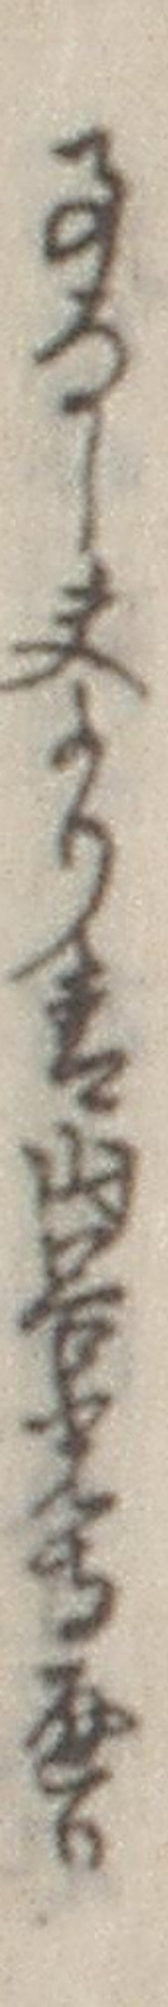事なし夫より青山善光寺通り
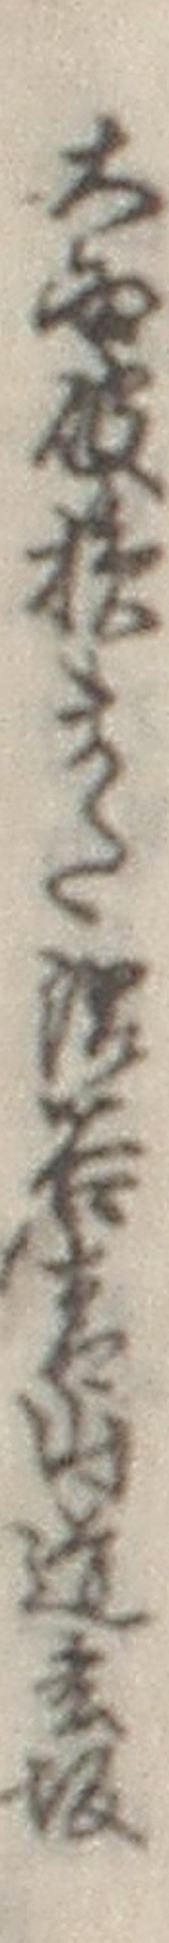大に破損また渋谷青山道玄坂
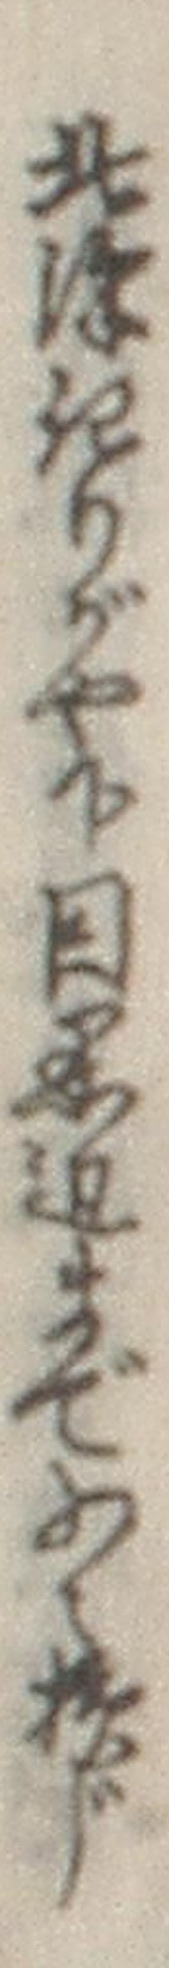北源きりがや下目黒辺まで少〻損じ
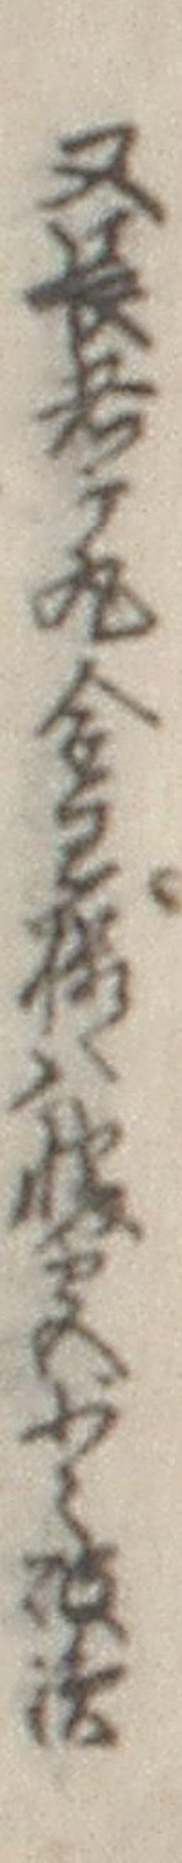又長者ケ丸金己様八幡宮少〻破損
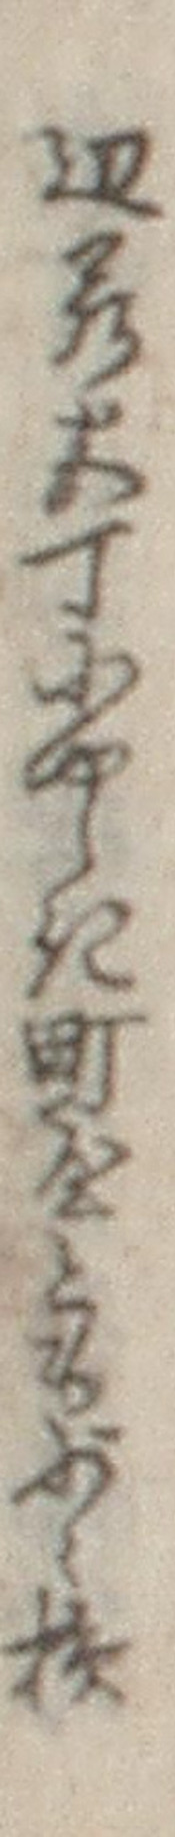辺彦宮丁小やしき町屋とも少〻損
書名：江戸　大地震臣細録　全
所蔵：東京大学地震研究所図書室 Earthquake Research Institute Library, The University of Tokyo, JAPAN
